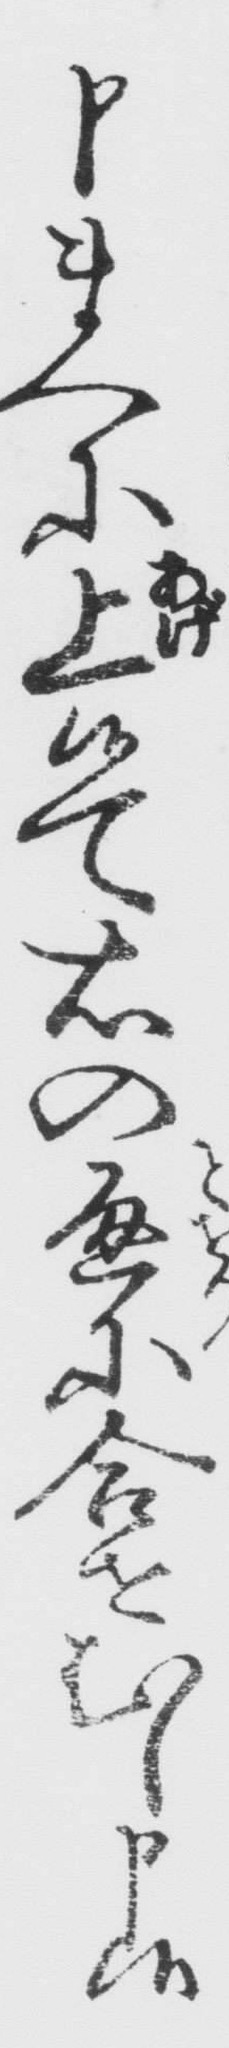申まへに上候て右之通に合せむし申候

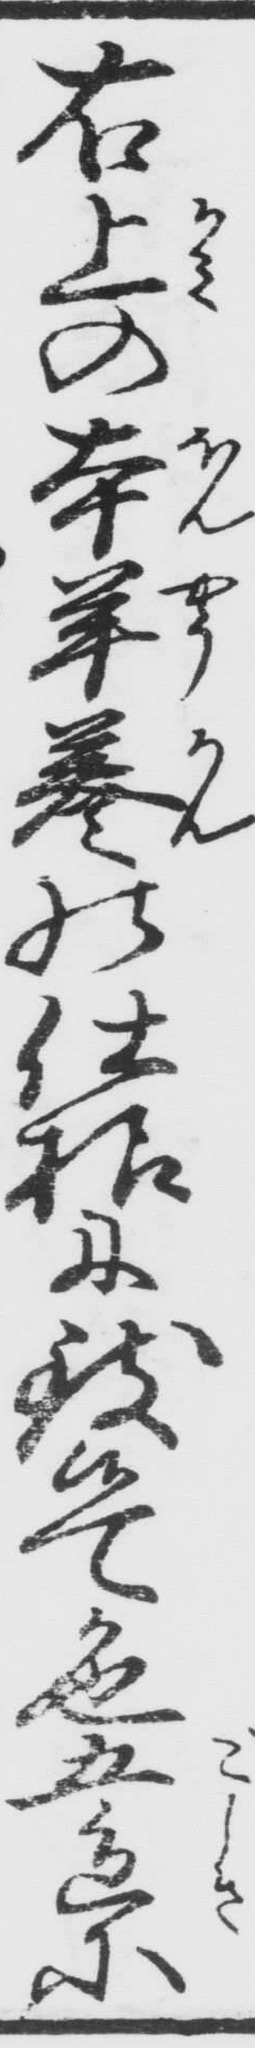右上の本羊羹の仕様に致候て色五色に
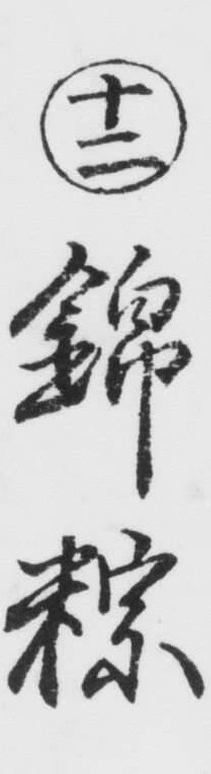(十二)錦粽
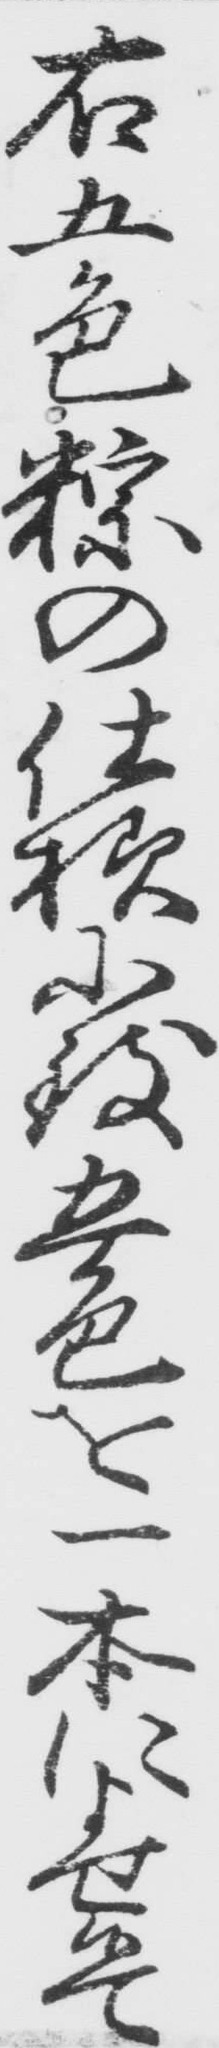右五色粽の仕様に致五色を一本によせ候て
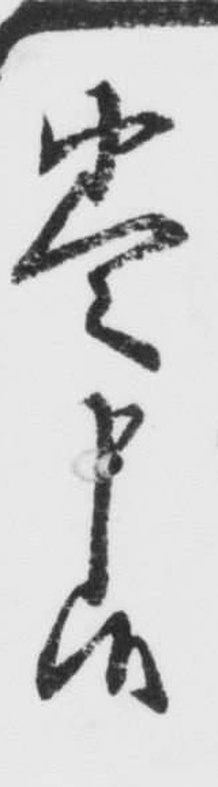巻申候
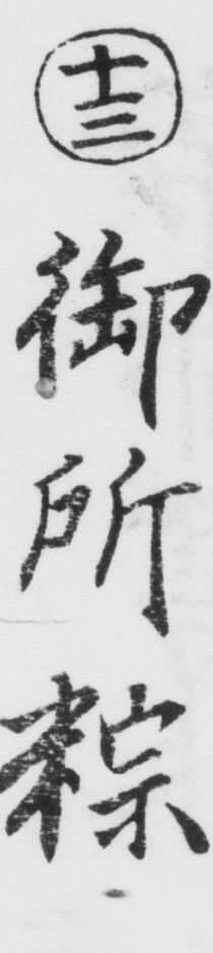(十三)御所粽
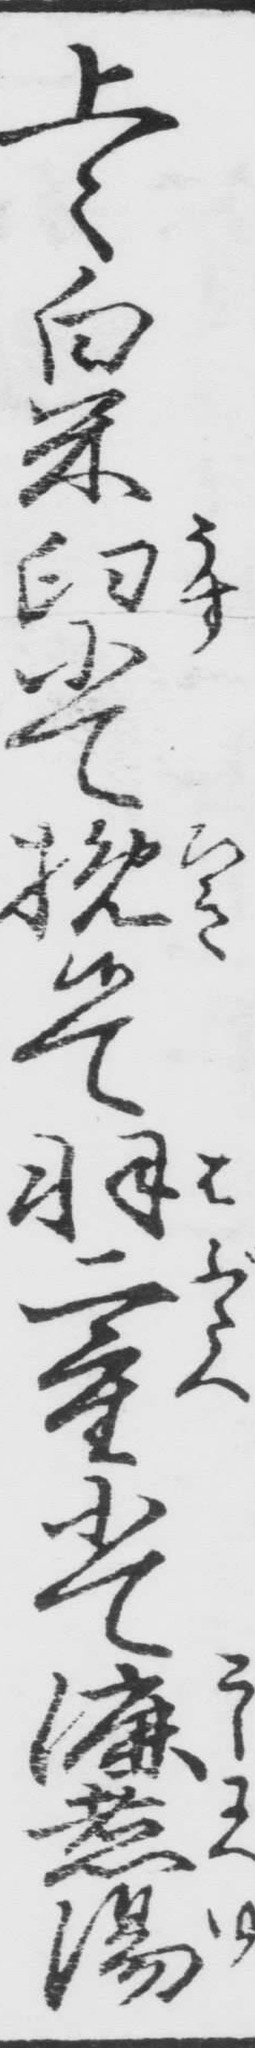上々白米臼にて挽候て羽二重にて漉煮湯
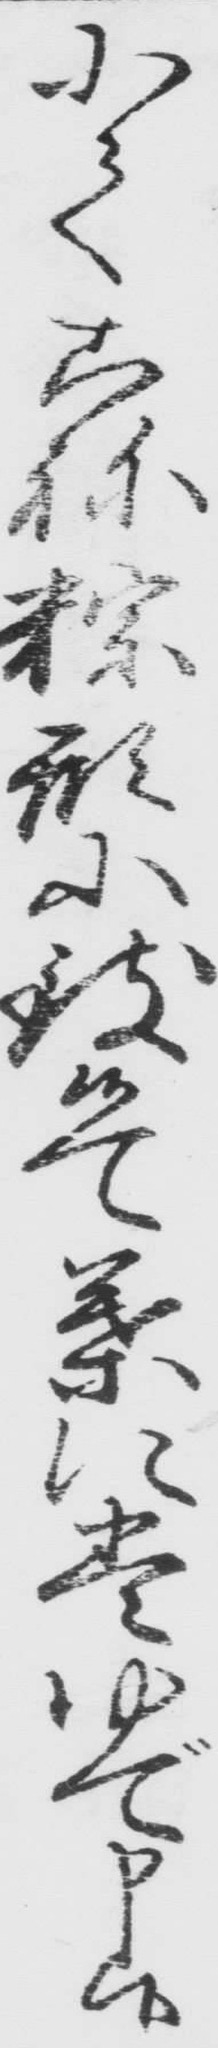にてこね粽形に致候て葉に巻ゆで申候
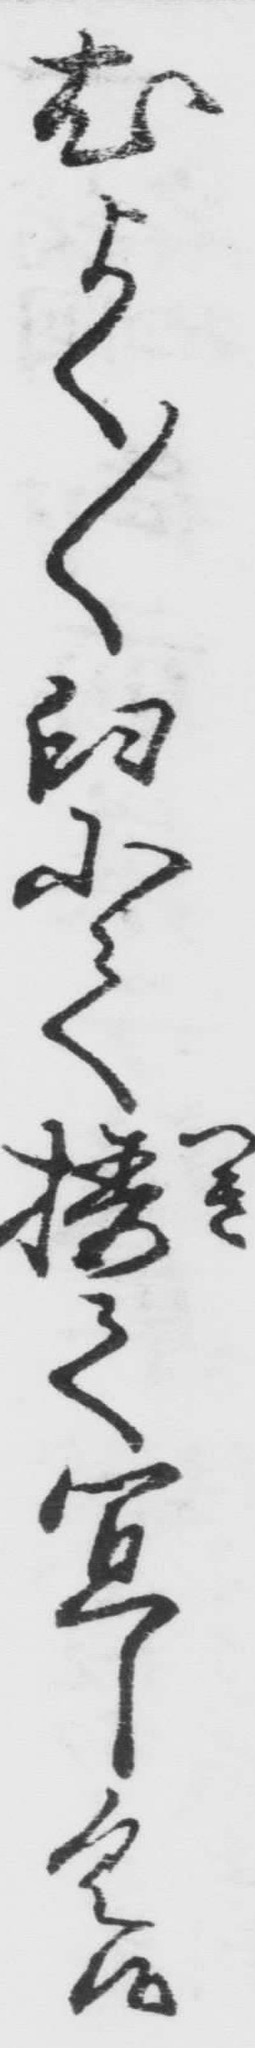尤よく〳〵臼にて擣て宜しく候

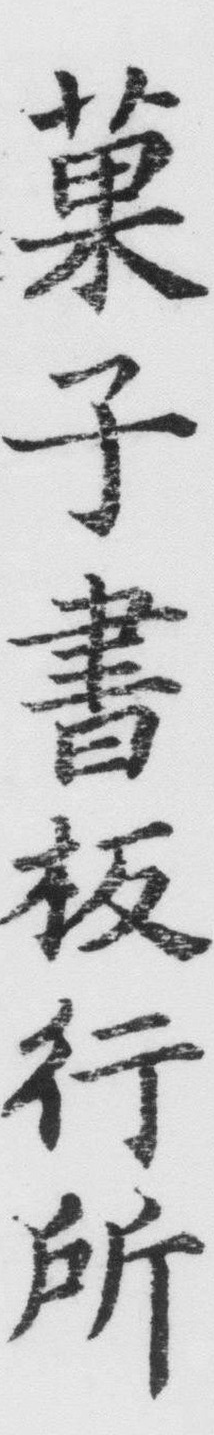菓子書板行所
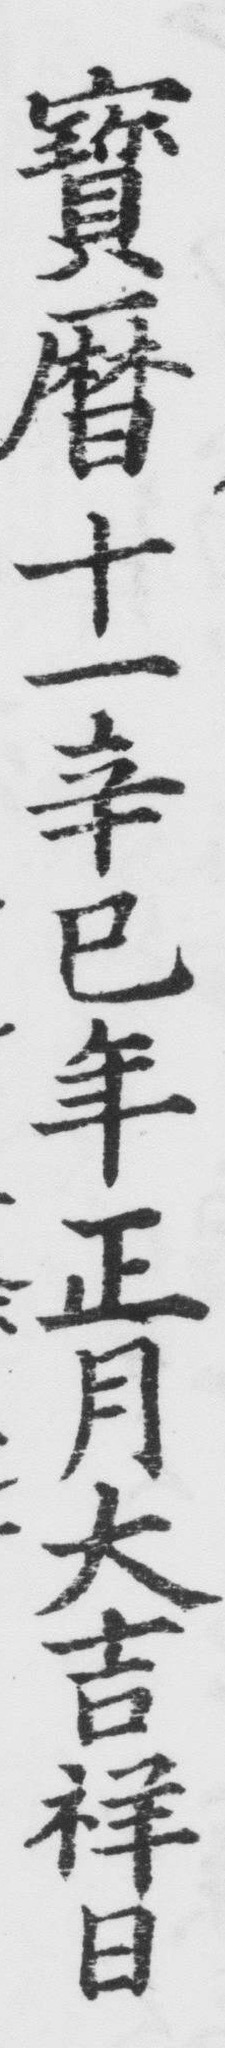宝暦十一辛巳年正月大吉祥日
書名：御前菓子図式
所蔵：大阪府立大学学術情報センター 国文学研究資料館
